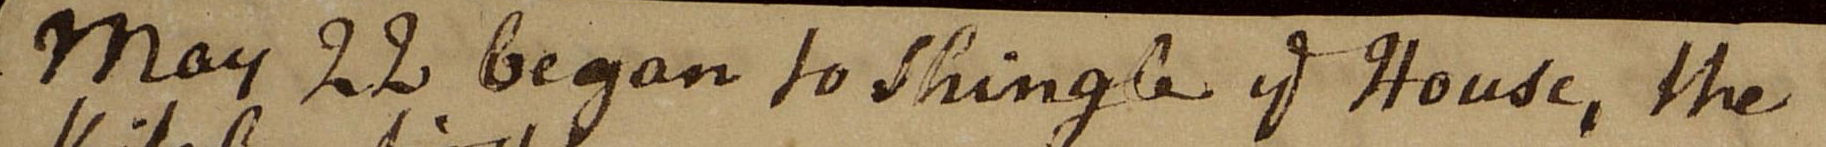May 22 began to shingle y^e House, the
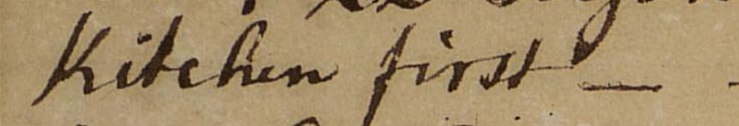Kitchen first-
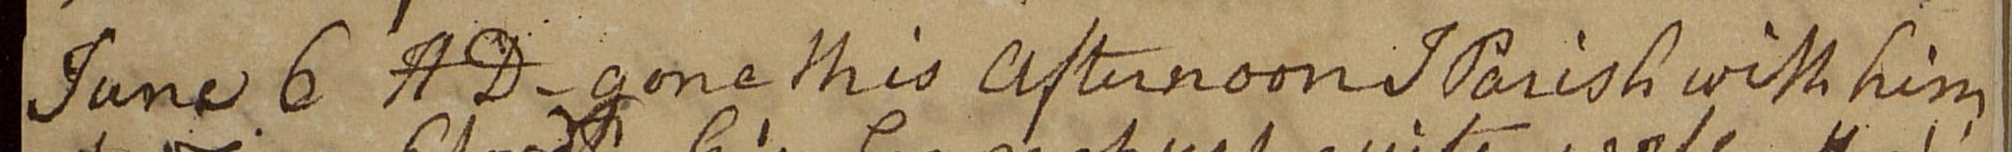June 6 HD- gone this Afternoon I Parish with him,
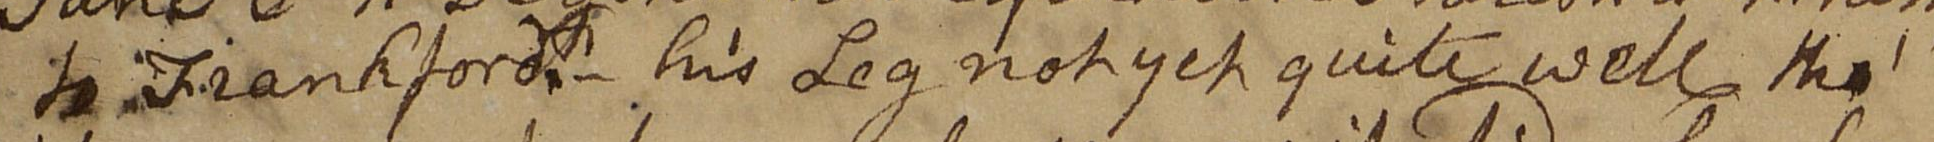to Frankford- his Leg not yet quite well, tho'
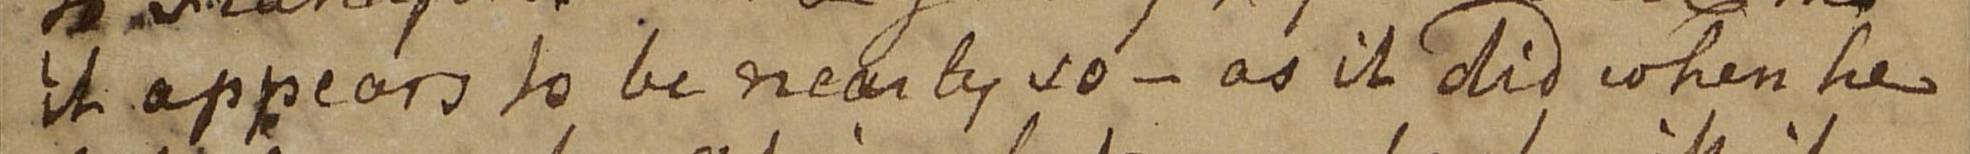it appears to be nearly so- as it did when he
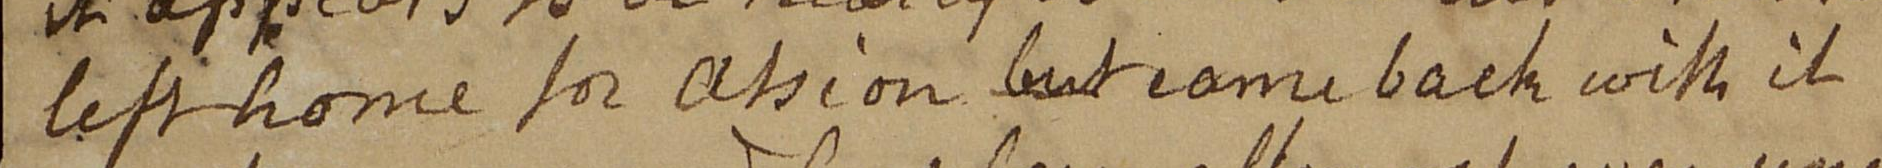left home for Atsion but came back with it
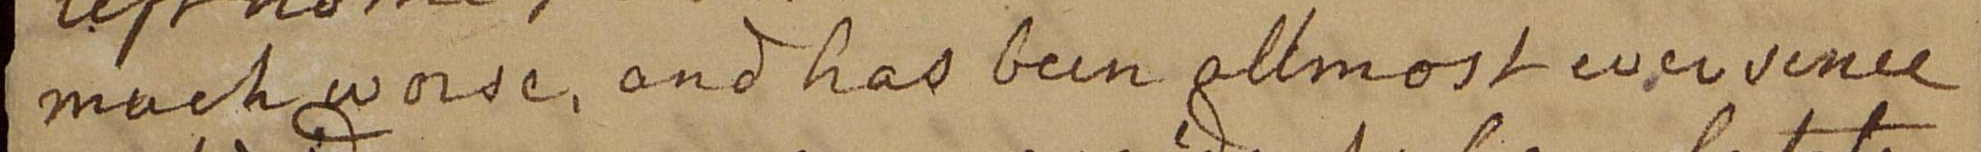much worse, and has been allmost ever since
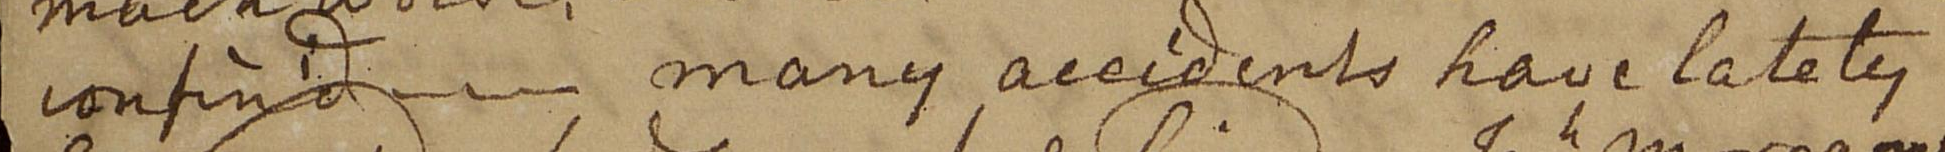confin'd-- many accidents have lately
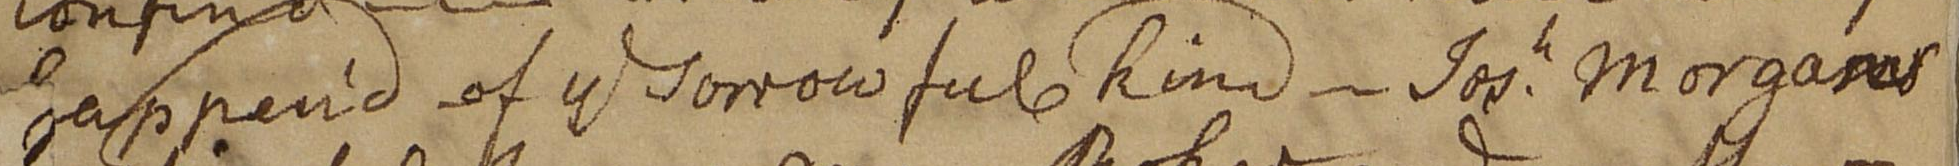happen'd of y^e sorrowful kind- Jos^h. Morgans
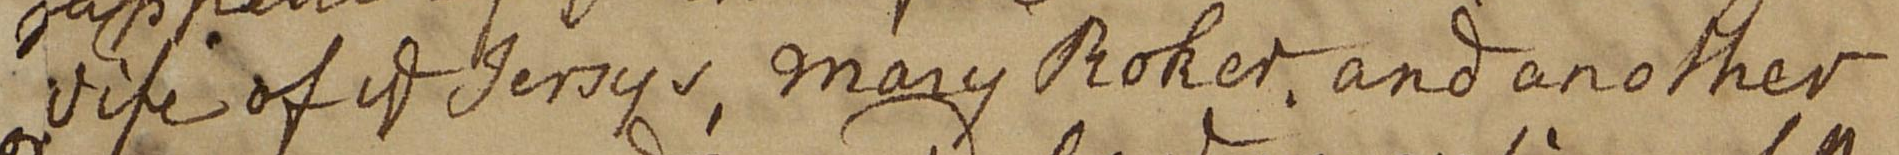wife of y^e Jersys, Mary Roker, and another
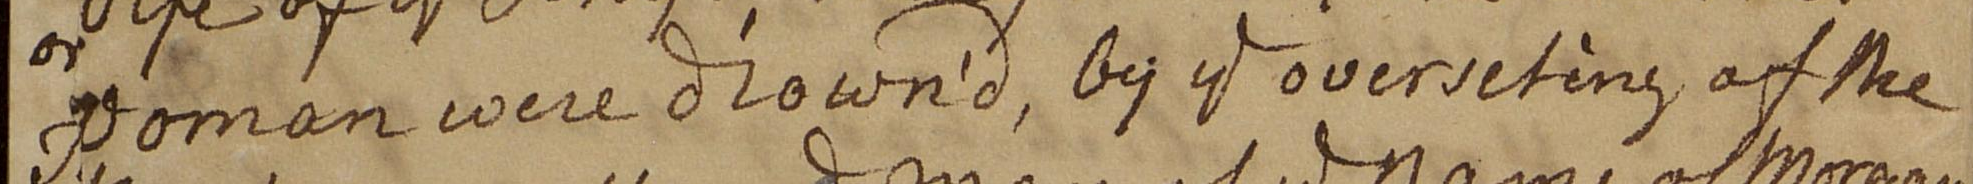Woman were drown'd, by y^e overseting of the
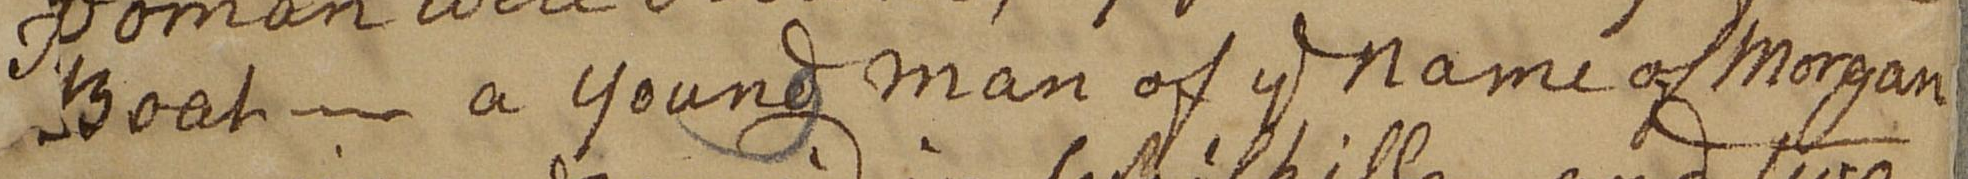Boat- a Young man of y^e name of Morgan
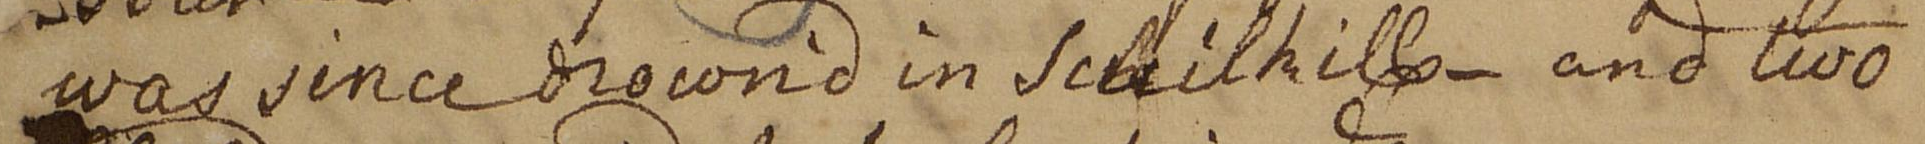was since drown'd in Scuilkill- and two
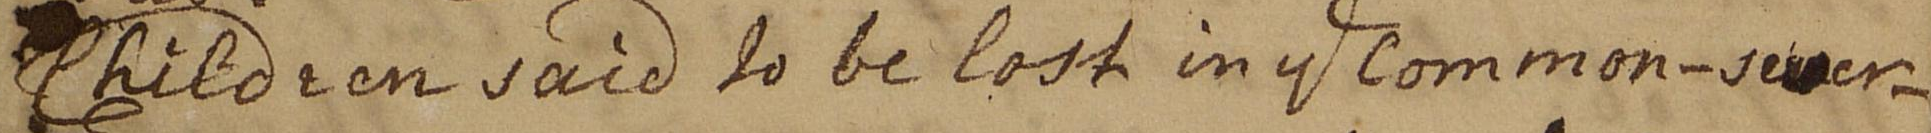Children said to be lost in y^e Common-sever-
